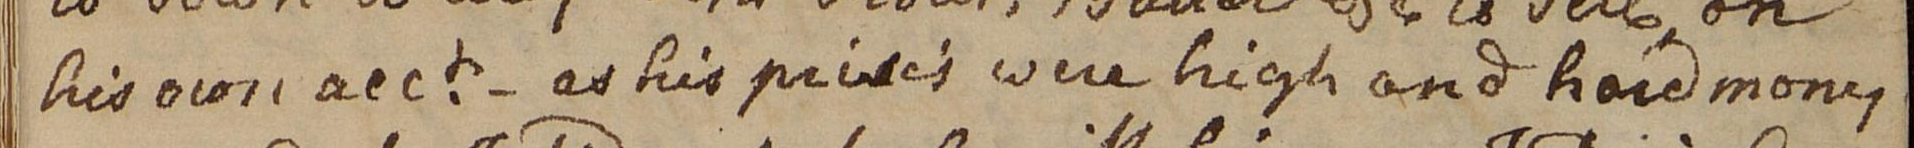his own acc^t.- as his prise's were high and hard mony
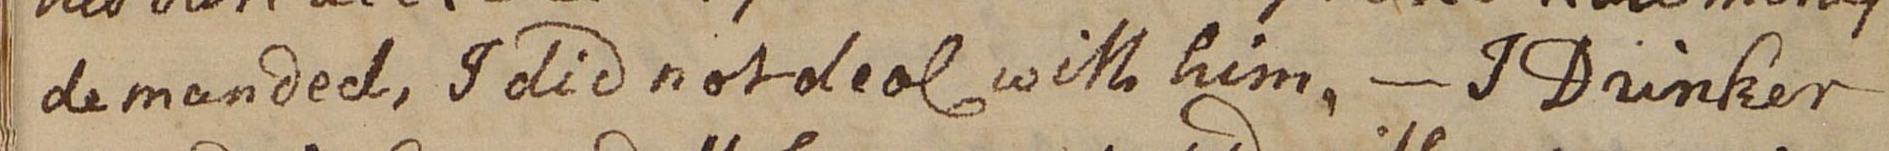demanded, I did not deal with him.- I Drinker
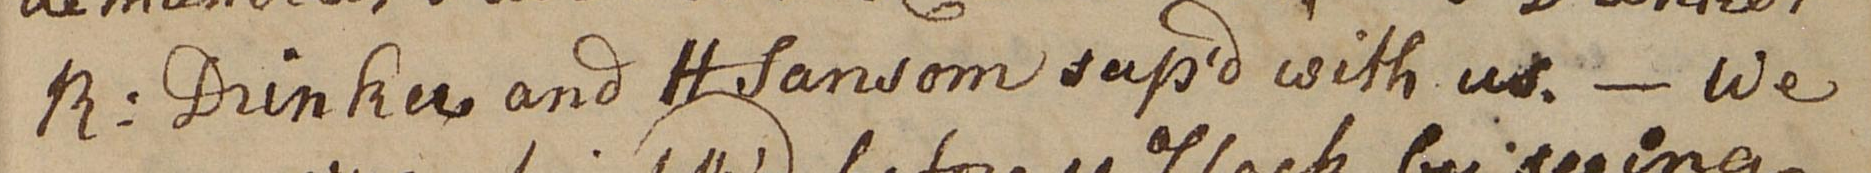R: Drinker and H Sansom sup'd with us.- We
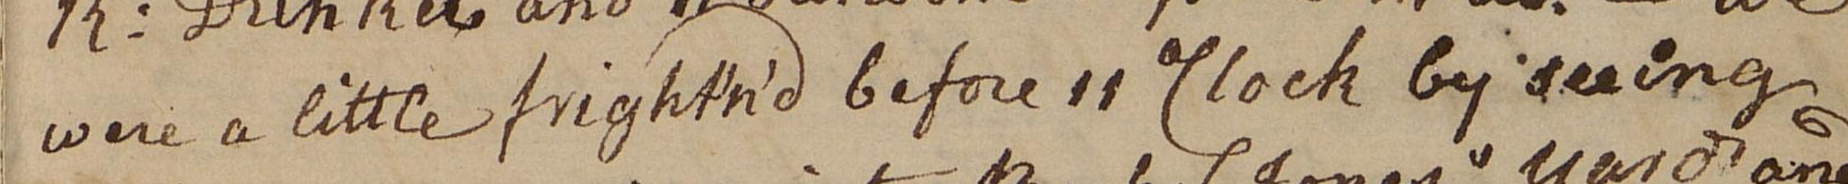were a little frightn'd before 11 ^oClock by seeing
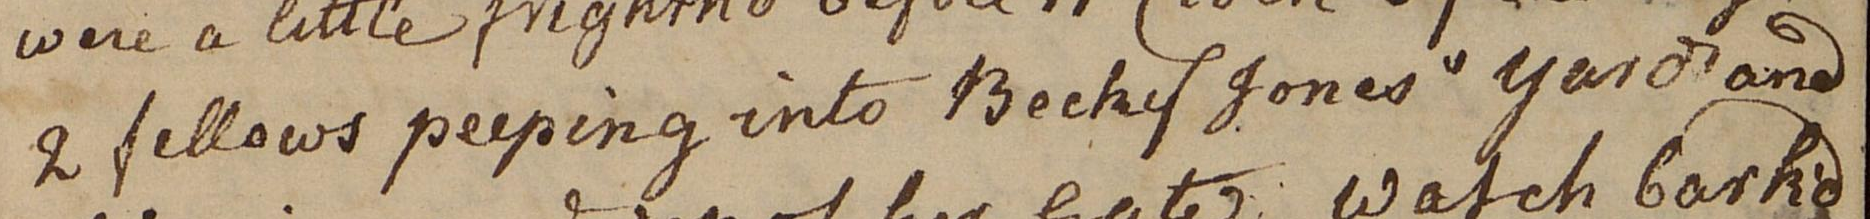2 fellows peeping into Becky Jones^s yard and
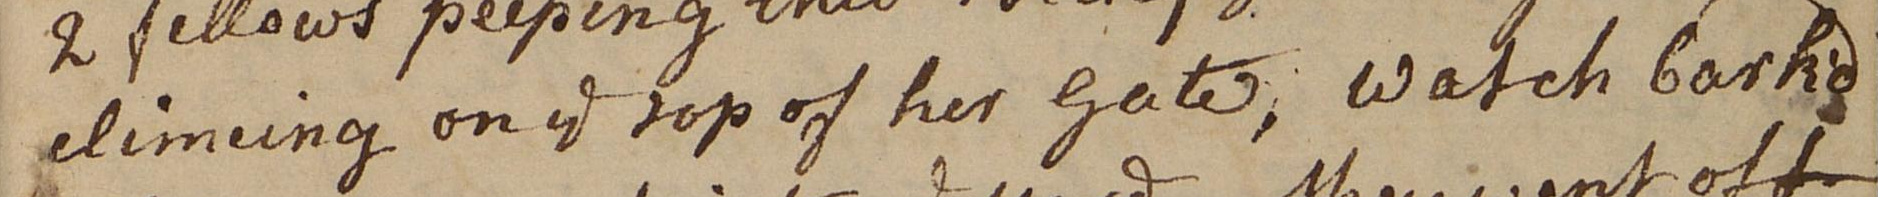climeing on y^e top of her Gate, watch bark'd
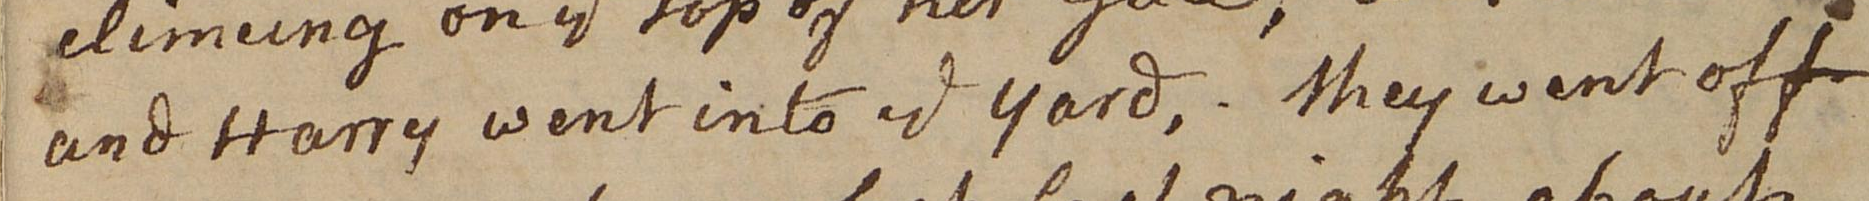and Harry went into y^e yard,. they went off
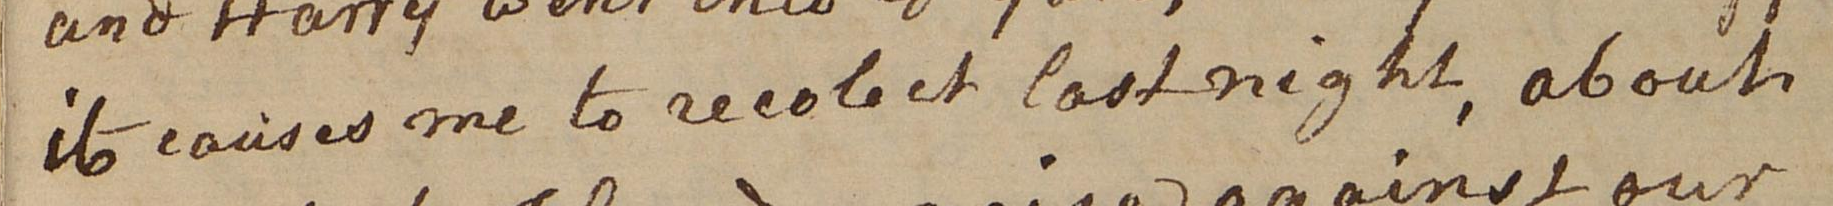it causes me to recolect last night, about
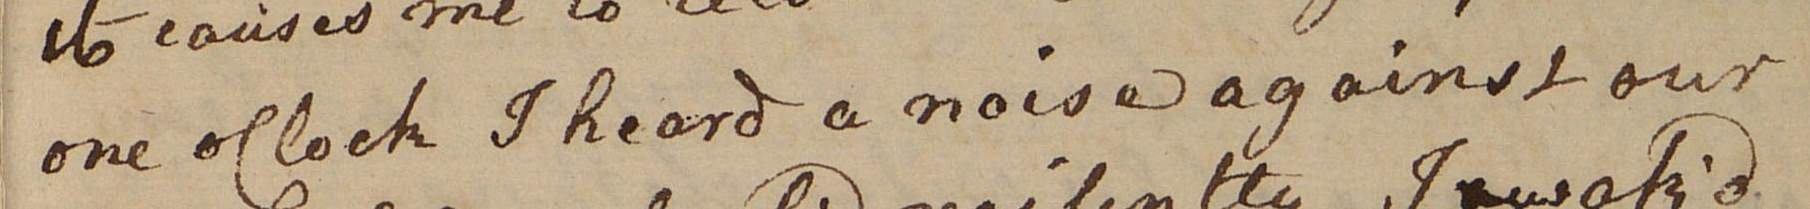one oClock I heard a noise against our
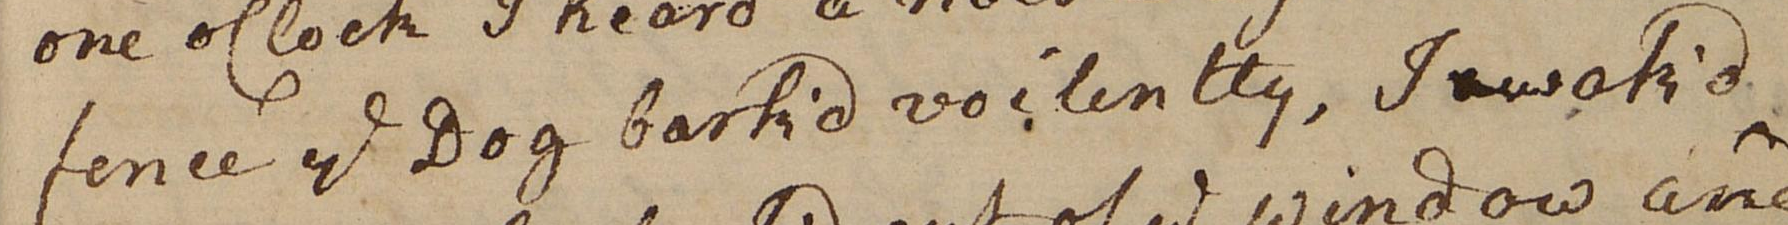fence y^e Dog bark'd voilently, I awak'd
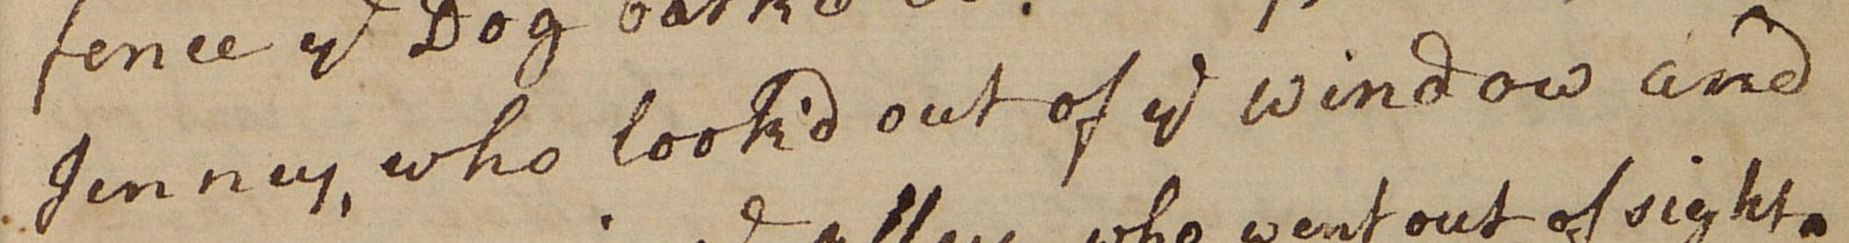Jenney, who look'd out of y^e window and
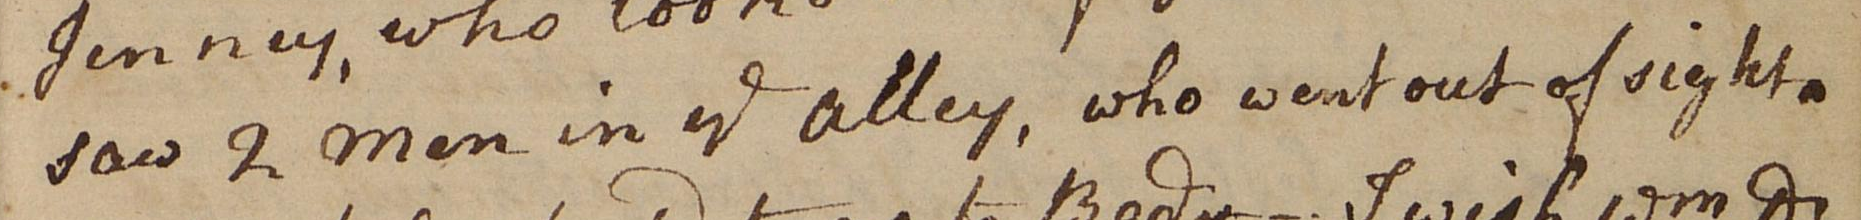saw 2 Men in y^e alley, who went out of sight.
